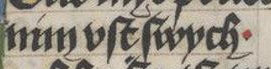ním vſt ſwych.
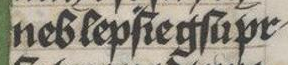neb lepẛie gſu pr¬
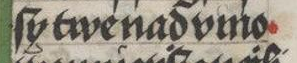ſy twe nad vino.
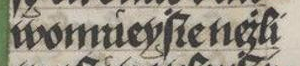wonnieyẛie neżli
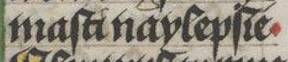maſti naylepẛíe
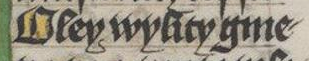Oley wylity gme¬
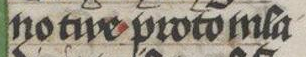no twe proto mla¬
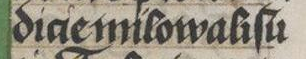dicie milowali ſu
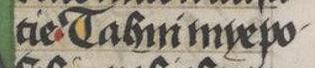tie.Tahni mye po
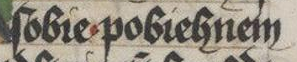ſobie pobiehnem
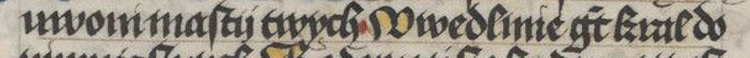uwoni maſtij twych.Vwedlmie ḡt kral do
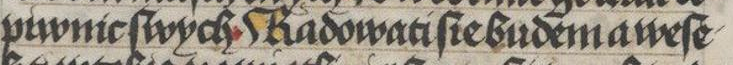prwnic ſwych Radowati ſie budem a weſe¬
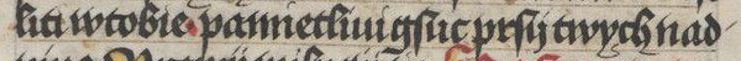liti w tobie pamietliui gſuc prſij twych nad
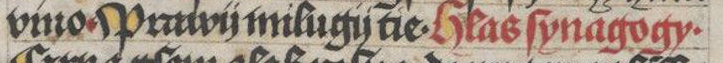víno Prawij milugij tie . Hlas synagogy
